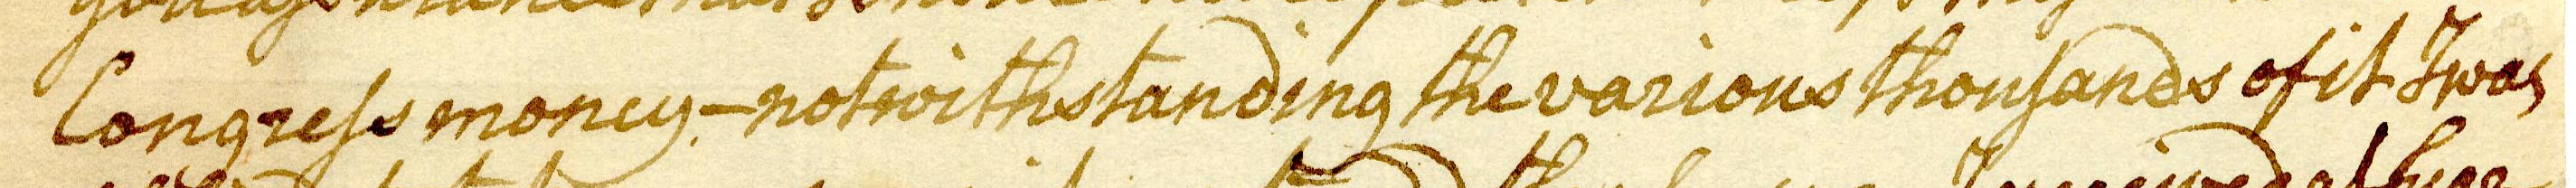Congress money- notwithstanding the various thousands of it I was
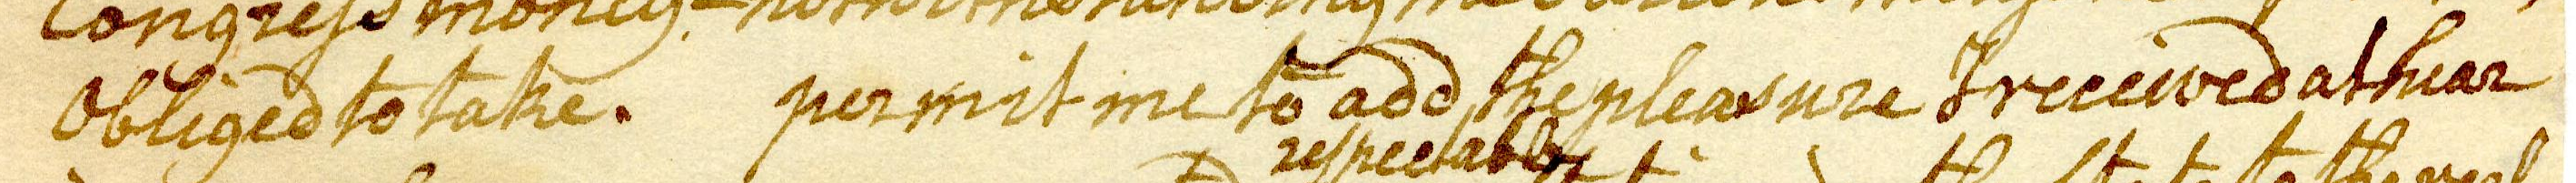Obliged to take. permit me to add, the pleasure I received at hear
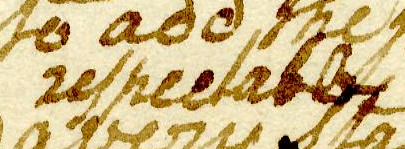respectable
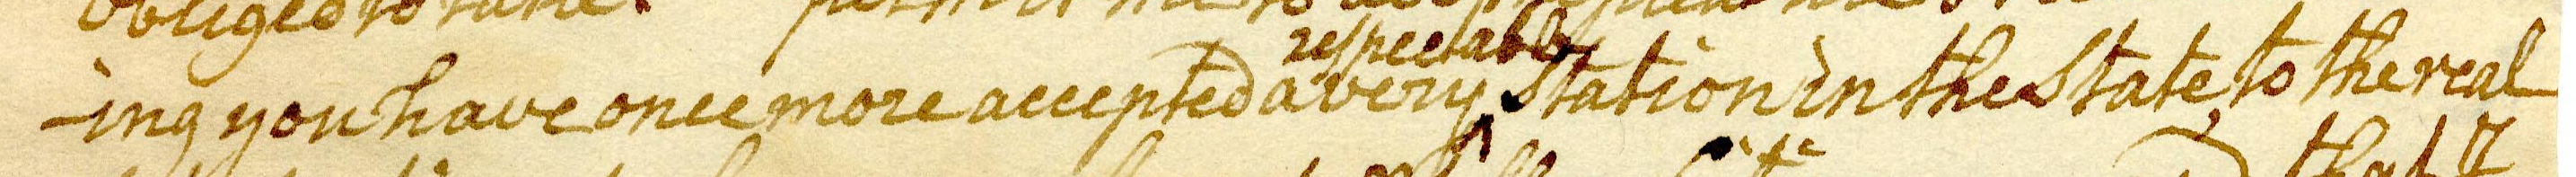-ing you have once more accented a very ^ station in the State, to the real
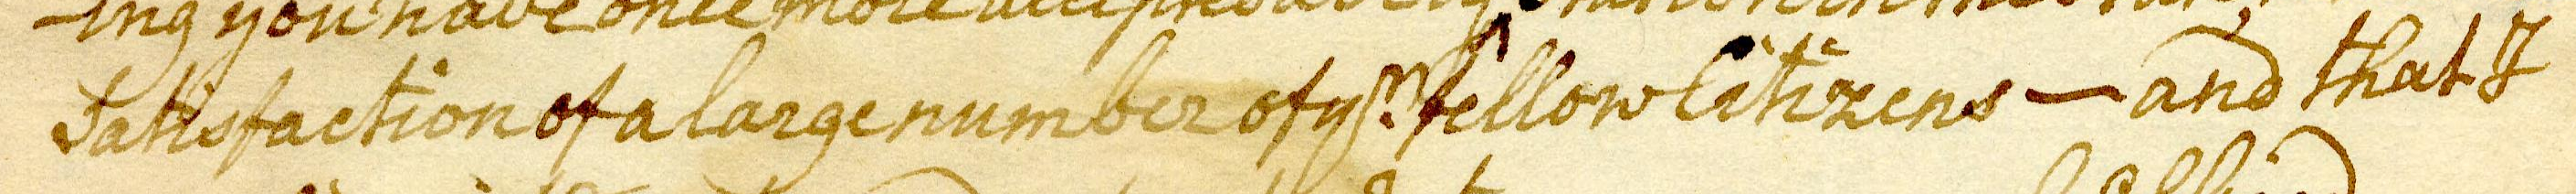Satisfaction of a large number of y^r. fellow Citizens- and that &
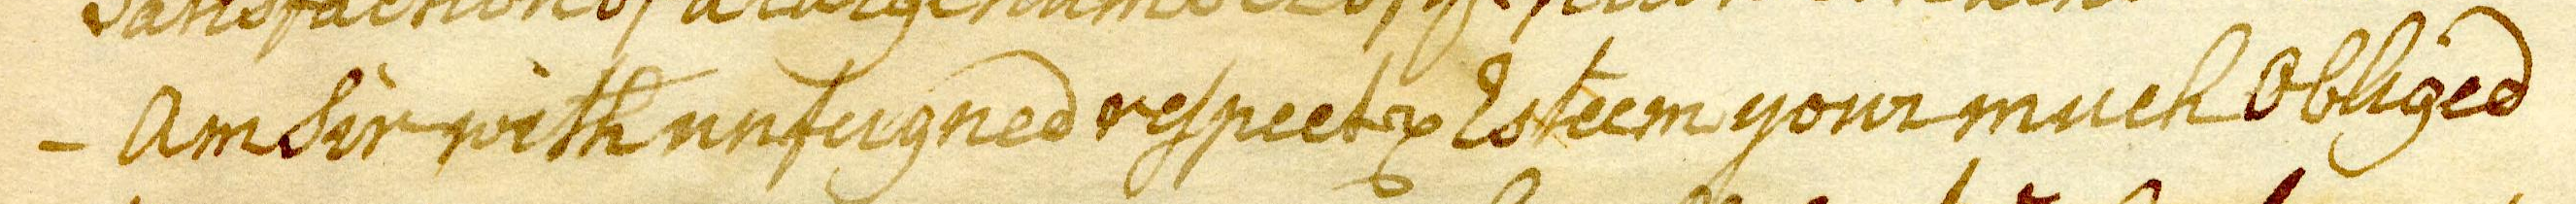Am Sir with unfeigned respect & Esteem your much Obliged
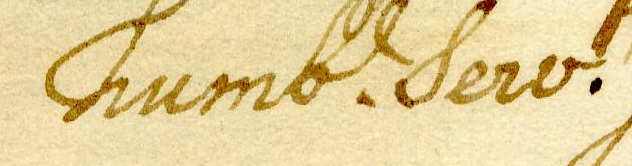humb^l. Serv^t.
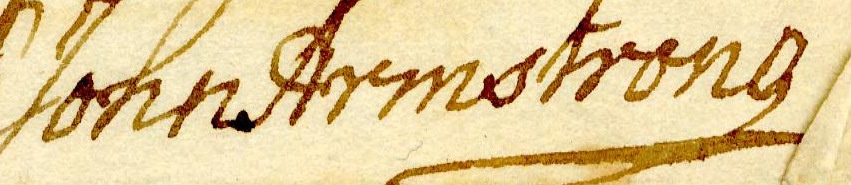John Armstrong
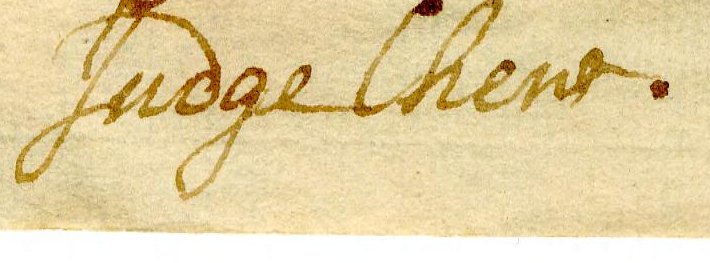Judge Chew.
